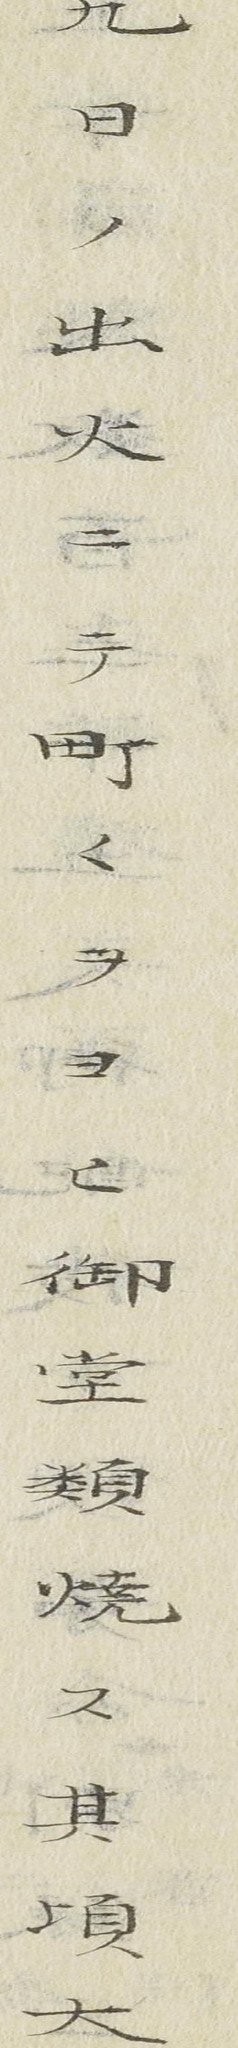九日ノ出火ニテ町々ヲヨヒ御堂類焼ス其頃大
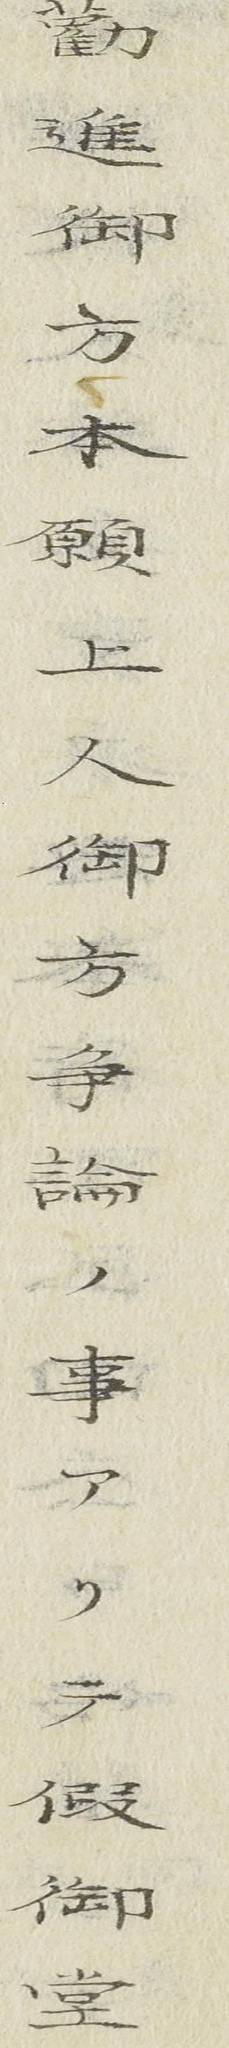勧進御方本願上人御方争論ノ事アリテ仮御堂
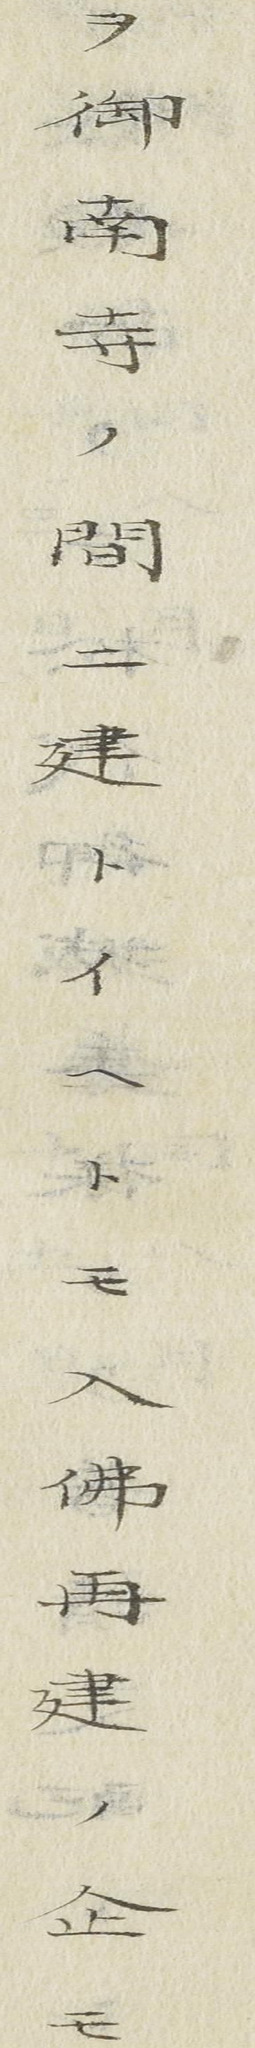ヲ御南寺ノ間ニ建トイヘトモ入仏再建ノ企モ
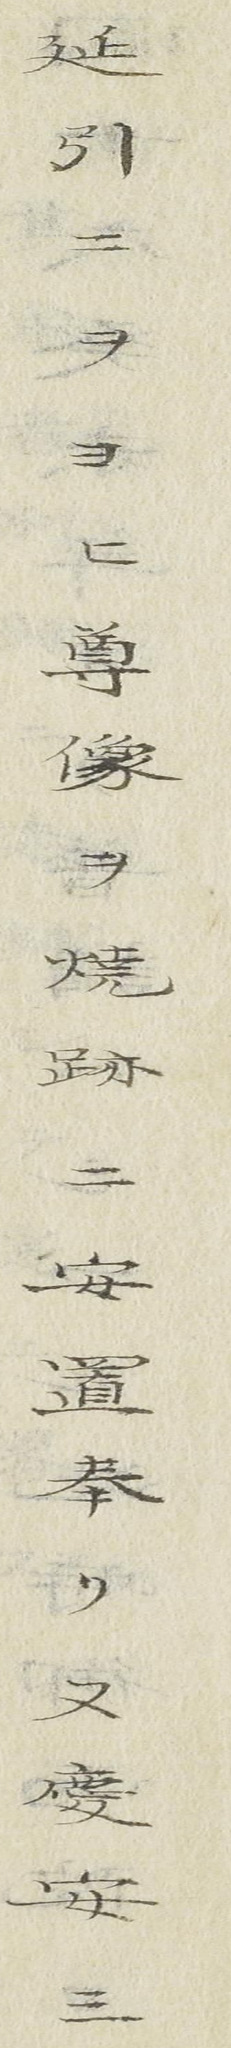延引ニヲヨヒ尊像ヲ焼跡ニ安置奉リヌ慶安三
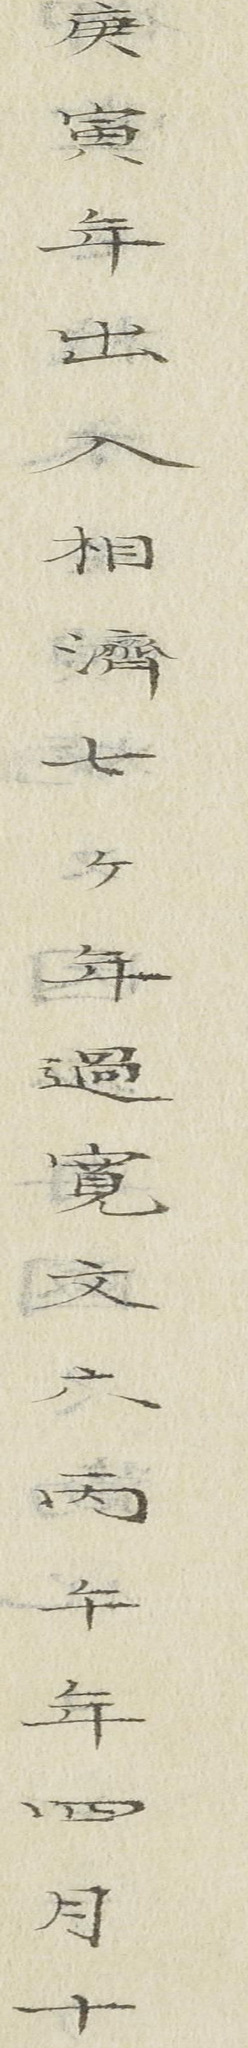庚寅年出入相済七ケ年過寛文六丙午年四月十
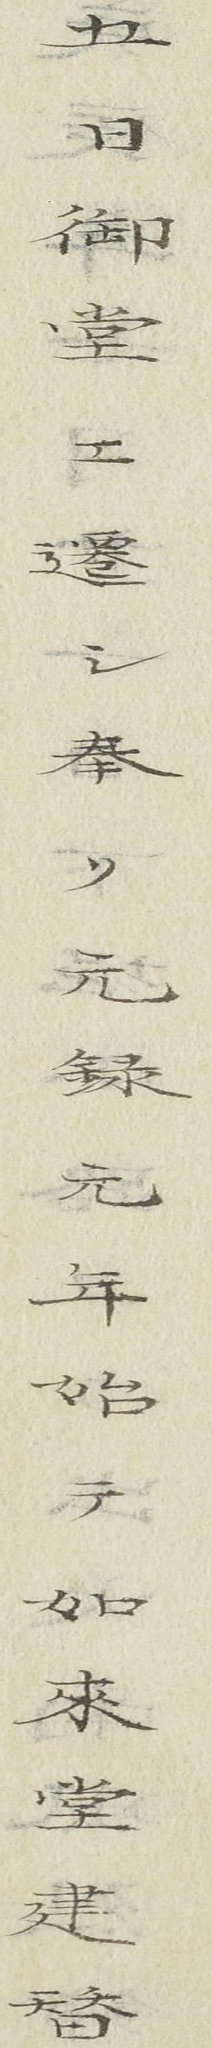五日御堂エ遷シ奉リ元禄元年始テ如来堂建替
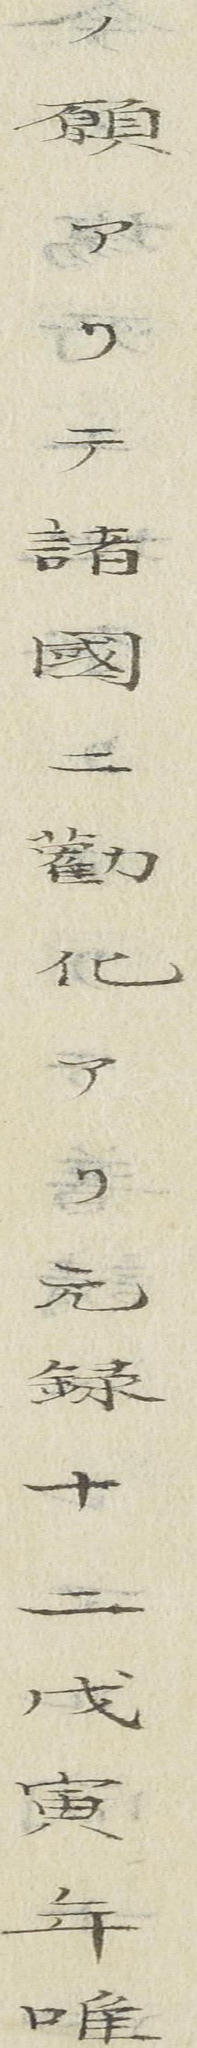ノ願アリテ諸国ニ勧化アリ元禄十二戌寅年唯

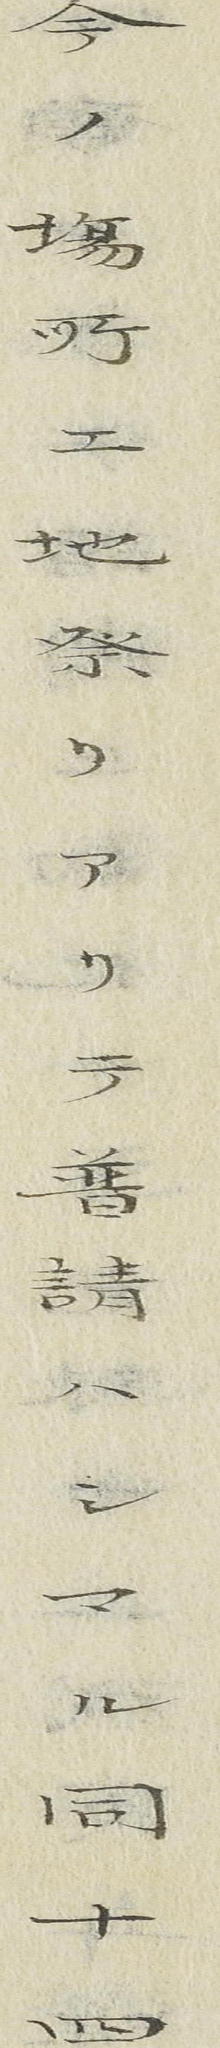今ノ場所エ地祭リアリテ普請ハシマル同十四
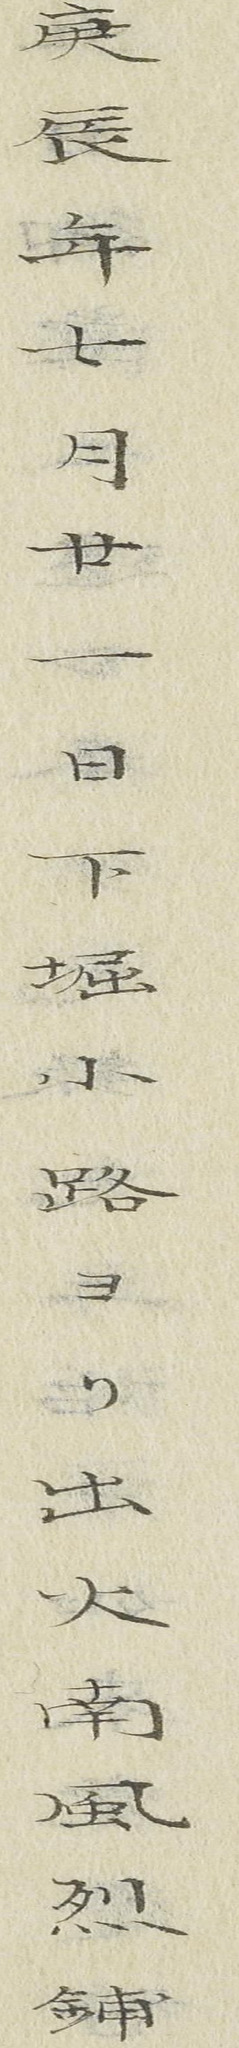庚辰年七月廿一日下堀小路ヨリ出火南風烈鋪
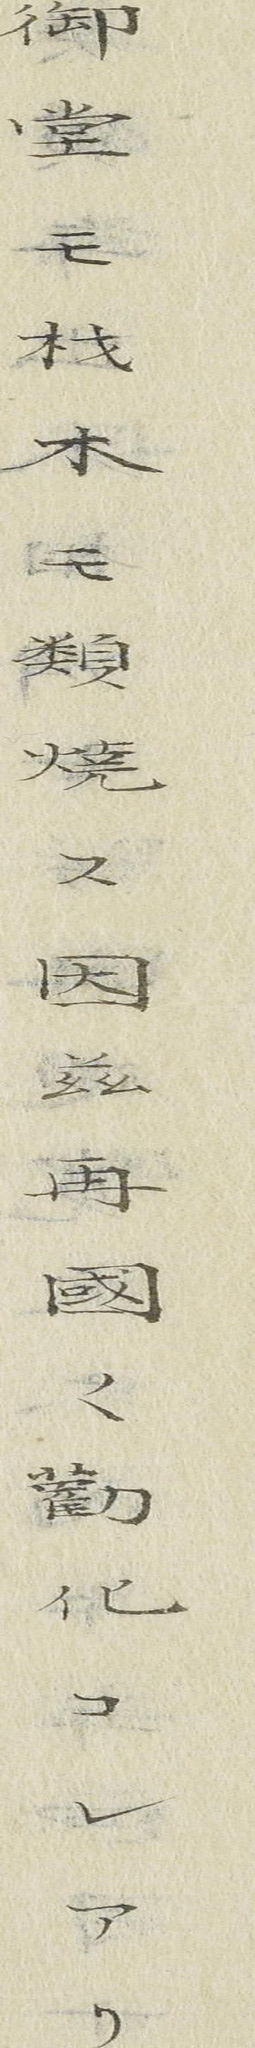御堂モ材木モ類焼ス因茲再国々勧化コレアリ
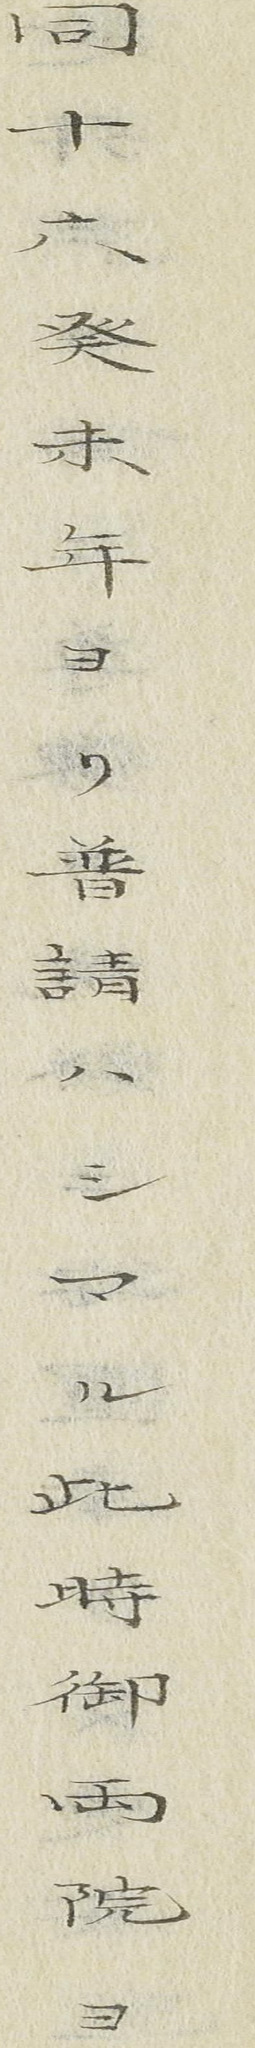同十六癸未年ヨリ普請ハシマル此時御両院ヨ
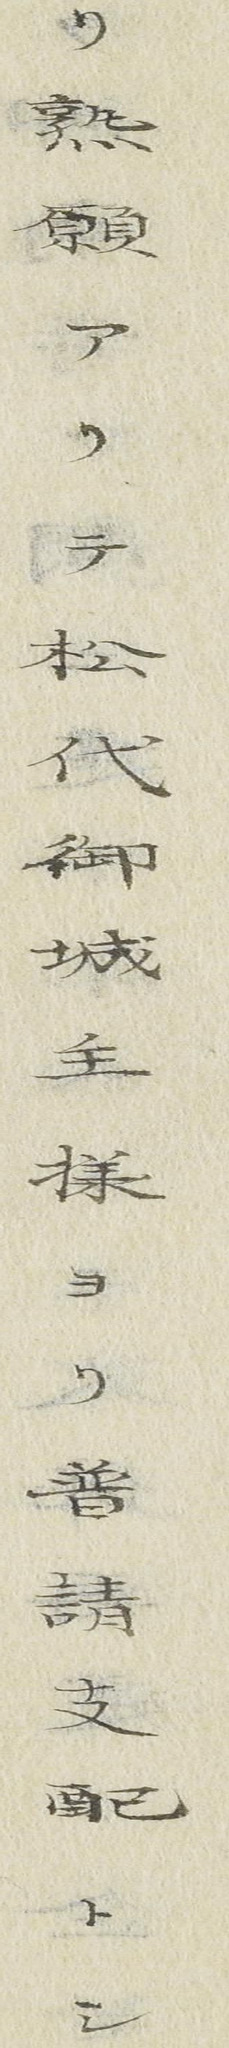リ熟願アリテ松代御城主様ヨリ普請支配トシ
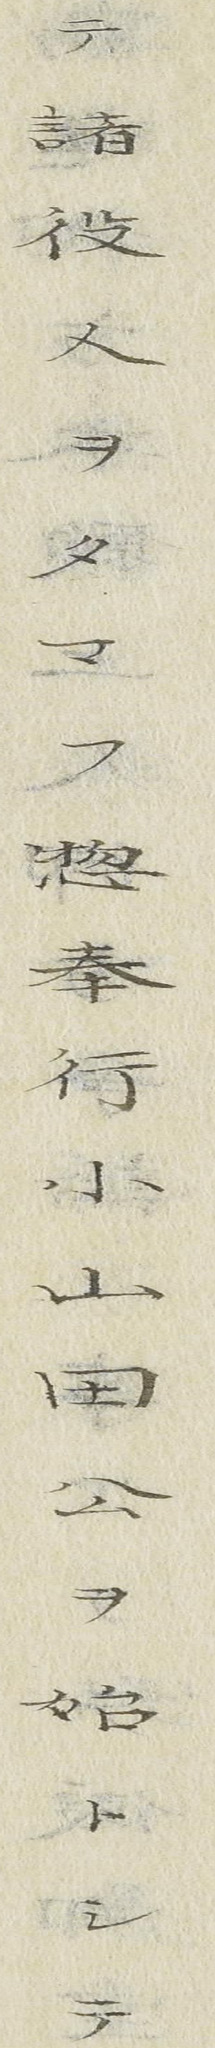テ諸役人ヲタマフ惣奉行小山田公ヲ始トシテ
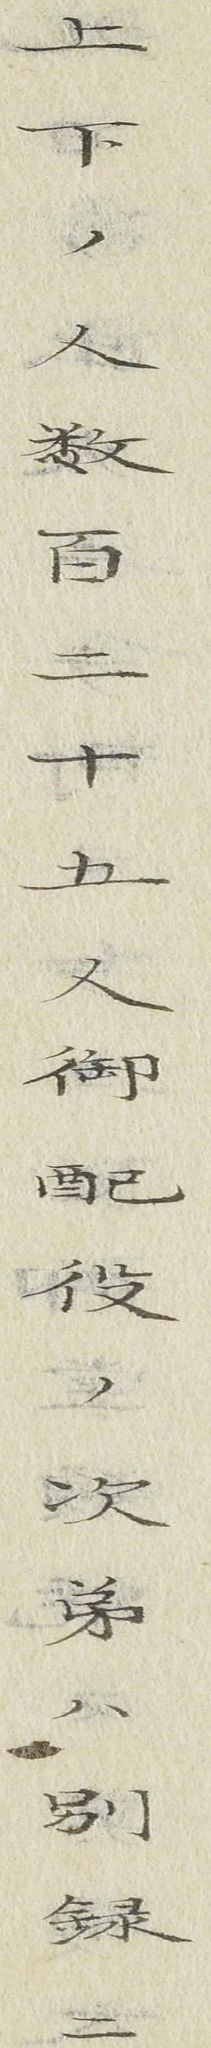上下ノ人数百二十五人御配役ノ次第ハ別録ニ
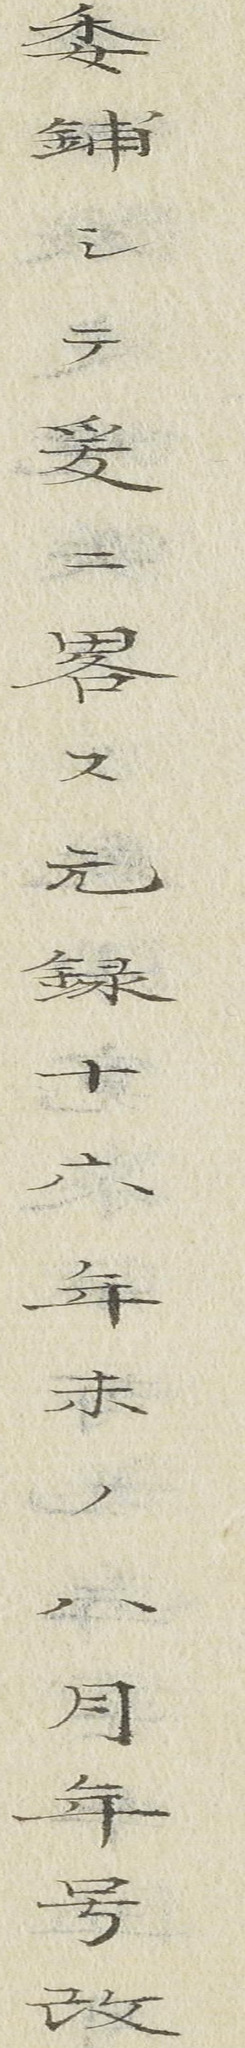委鋪シテ爰ニ略ス元禄十六年未ノ八月年号改
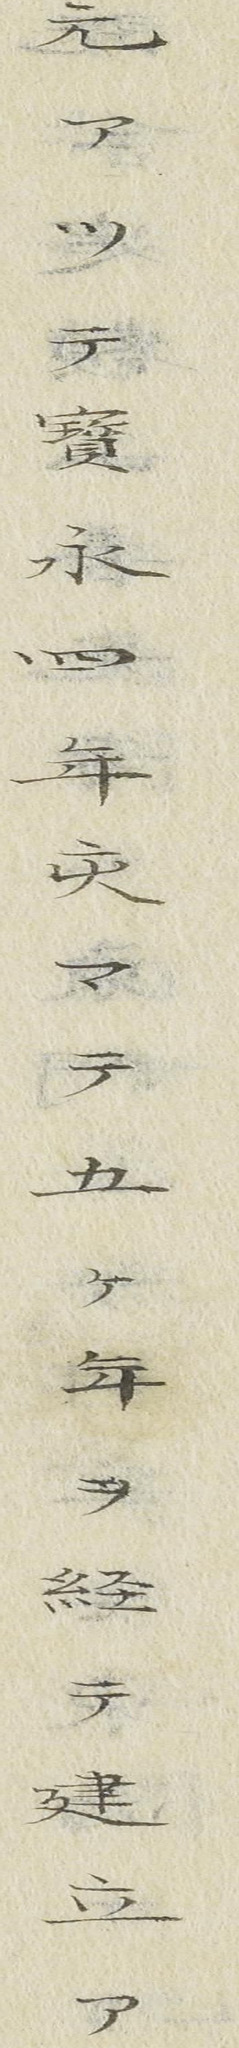元アツテ宝永四年亥マテ五ケ年ヲ経テ建立ア
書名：地災撮要　地震之部　巻ノ二
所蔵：東京大学地震研究所図書室 Earthquake Research Institute Library, The University of Tokyo, JAPAN
